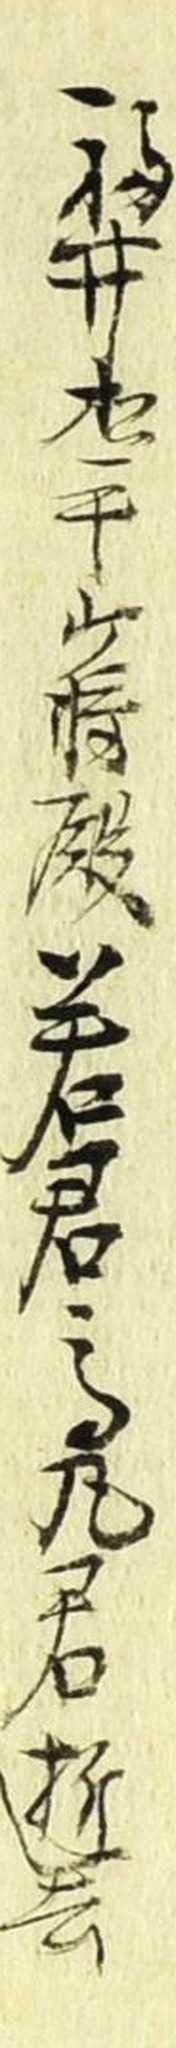福井松平少将殿若君高丸君逝去
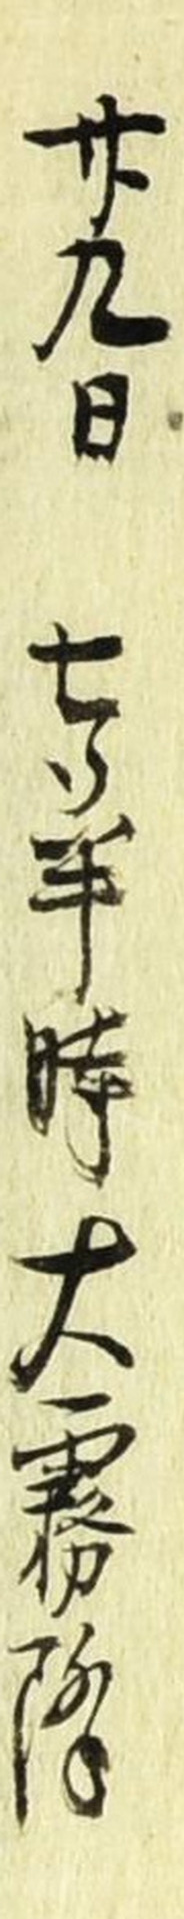廿九日七ツ半時大霧降
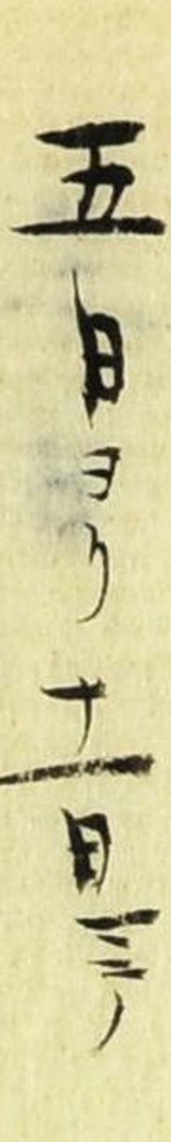五日より十一日まて
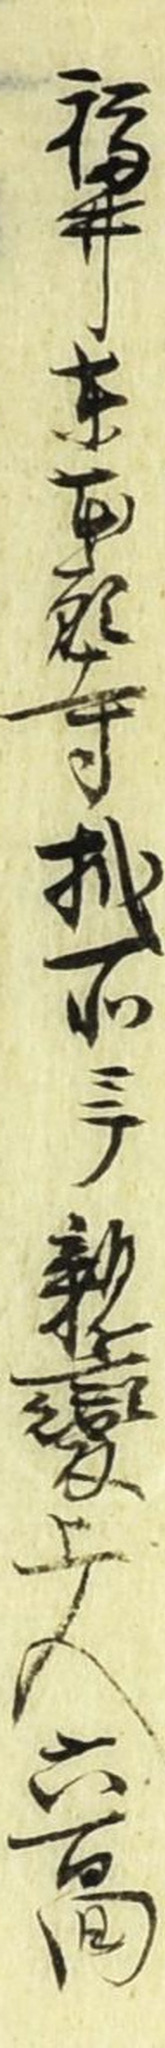福井東本願寺掛所にて親鸞上人六百回
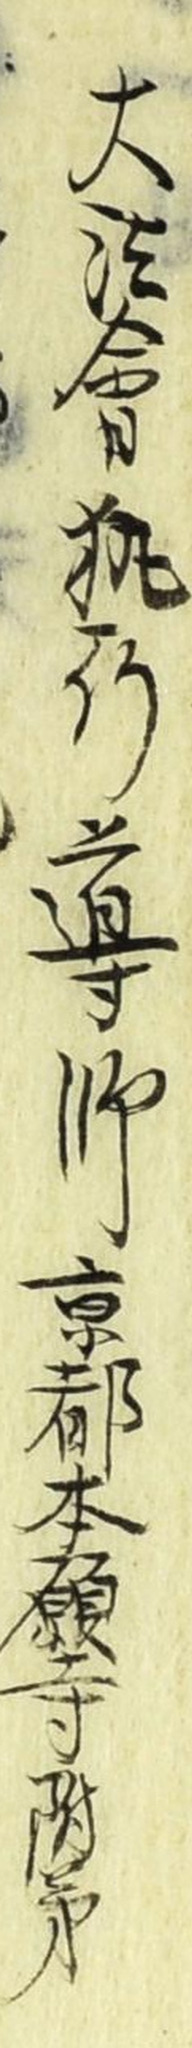大法会執行導師京都本願寺附弟
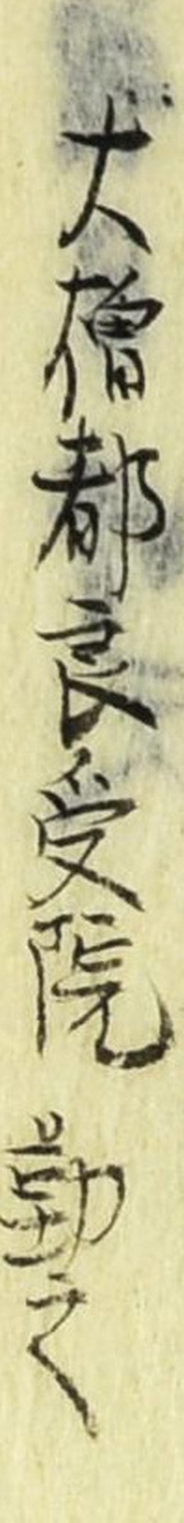大僧都良受院勤之
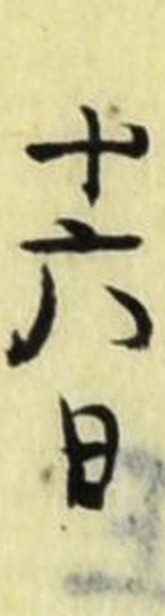十六日
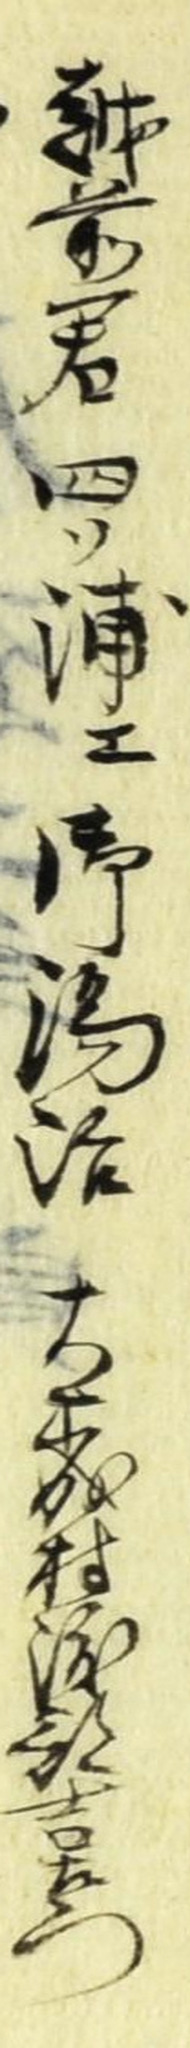越前君四ツ浦え御湯治大森村渡部吉左衛門
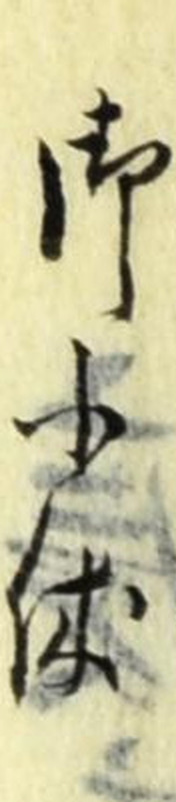御小休
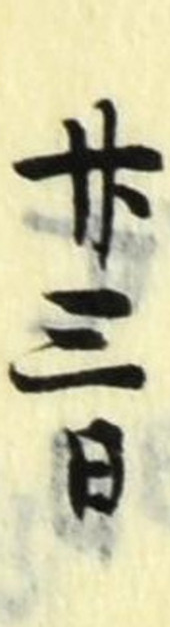廿五日
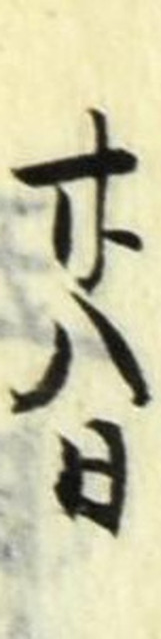十八日

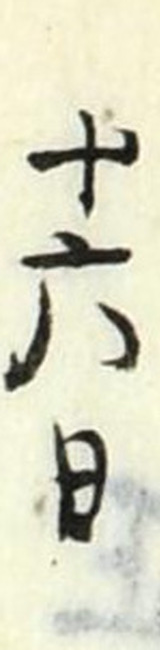十四日
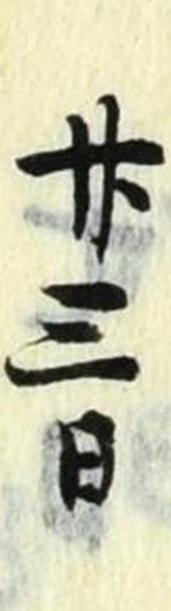廿三日
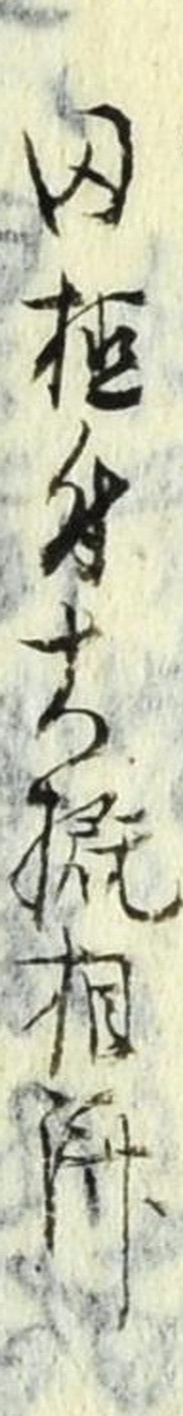田植付大概相済
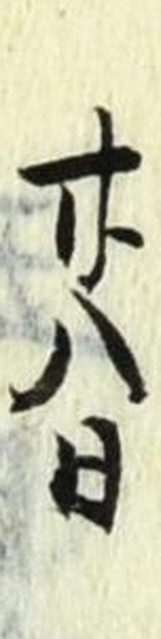廿八日
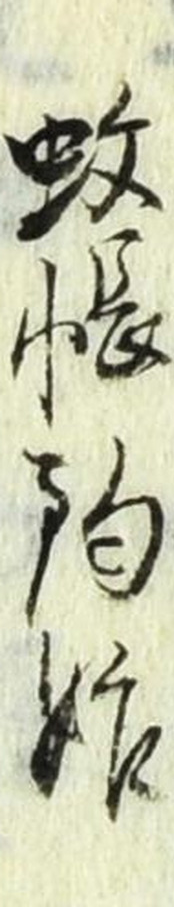蚊帳釣始
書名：（日記）
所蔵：福井県文書館 Fukui Prefectural Archives
